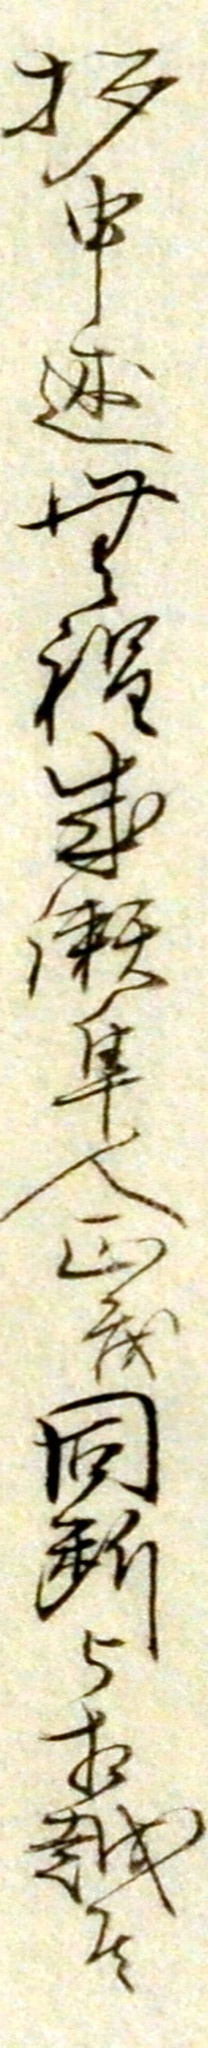拶申述無程成瀬隼人正も同断被相越候
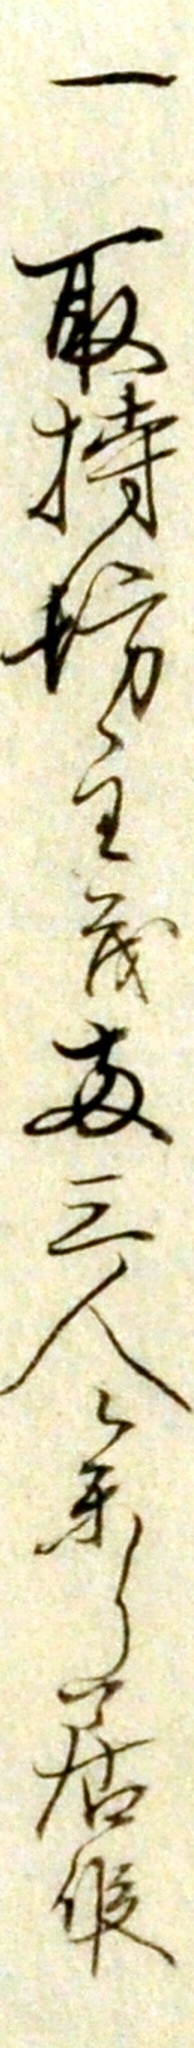一取持坊主も両三人参り居候
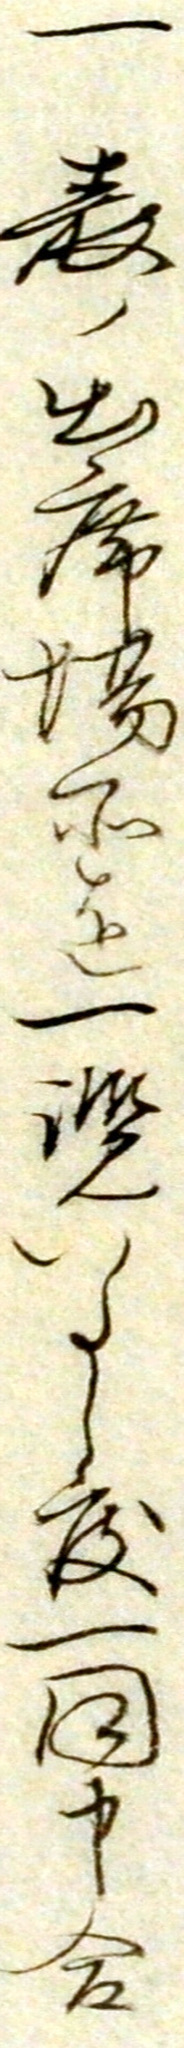一表ノ出席場所を一覧いたし度一同申合
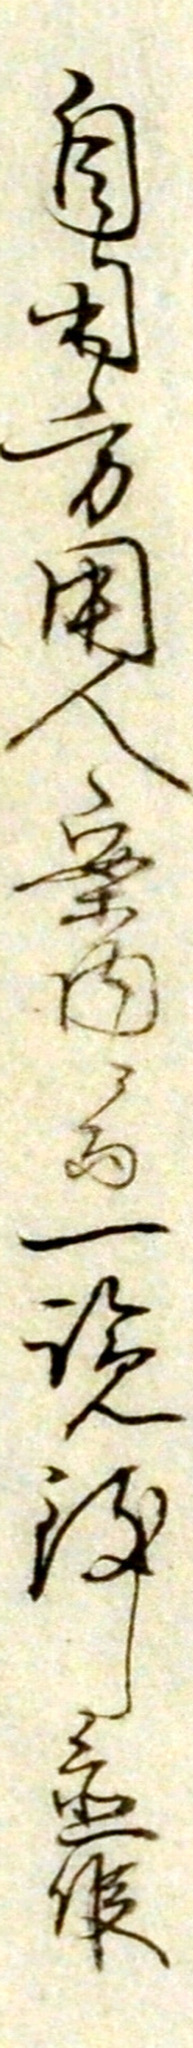自用方用人案内ニ而一覧致し置候
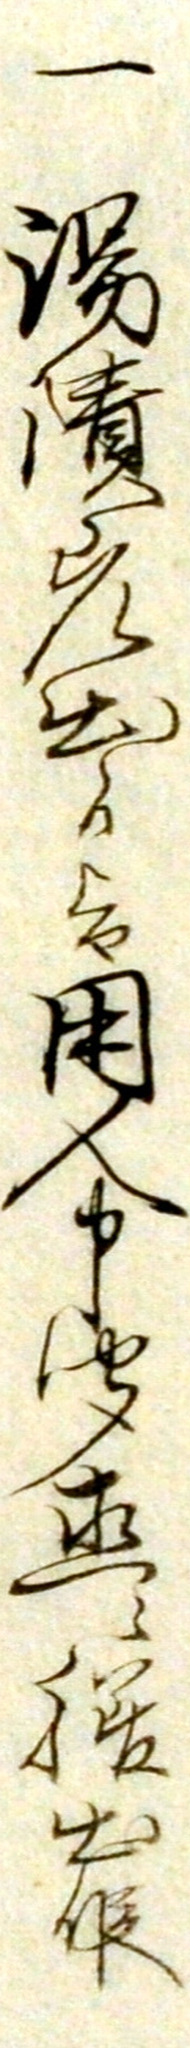一湯漬差出候旨用人申聞直ニ膳出候
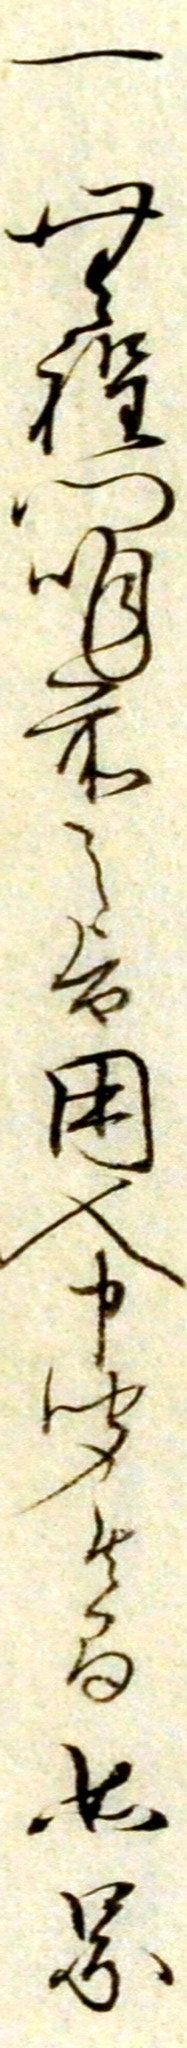一無程門明前之旨用人申聞候間如図
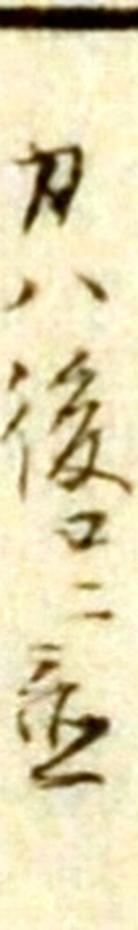刀ハ後ロニ置
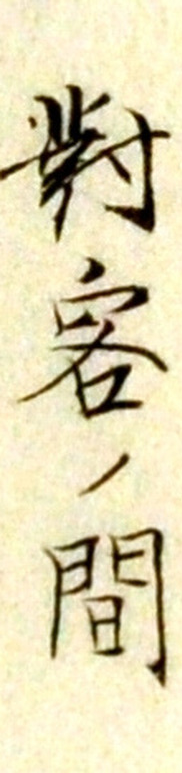対客ノ間

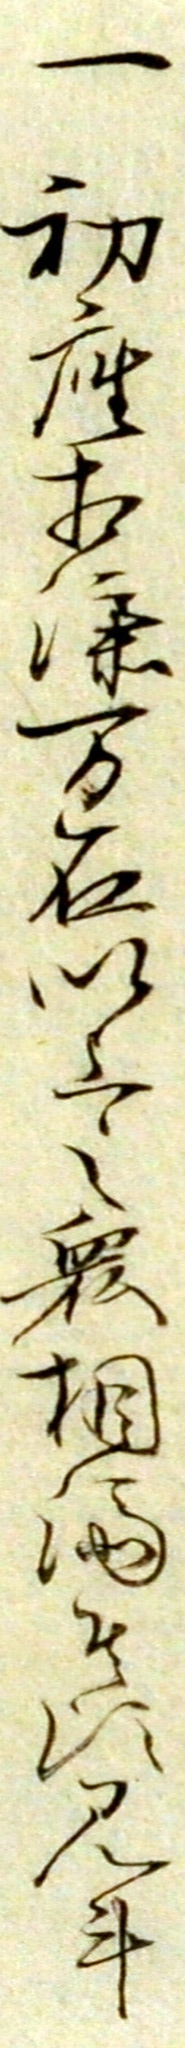一初座相済万石以上之衆相済候頃見計
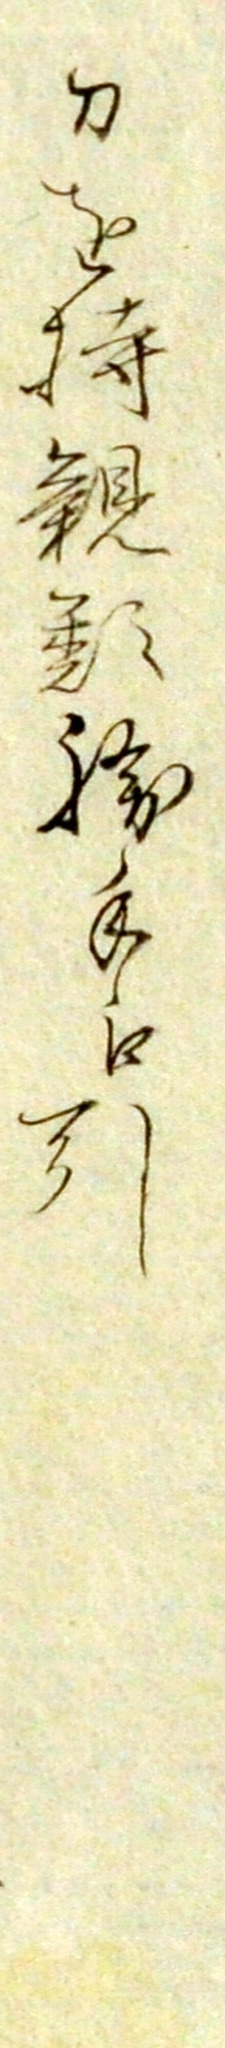刀を持親類勝手え引
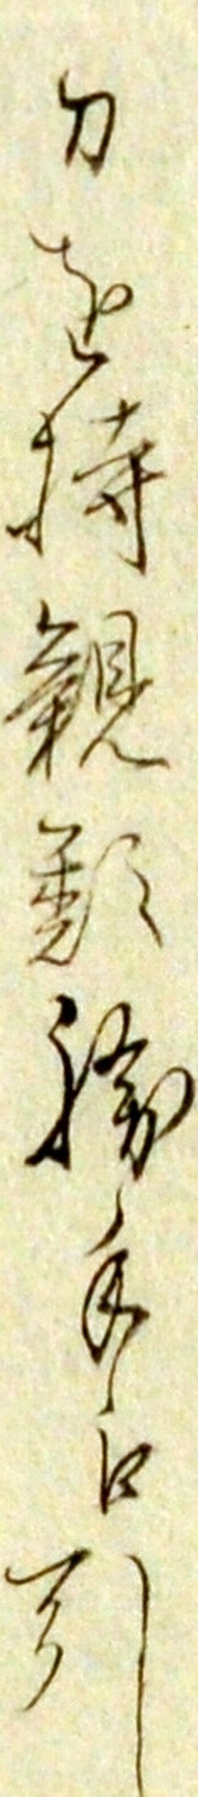刀を持親類勝手え引
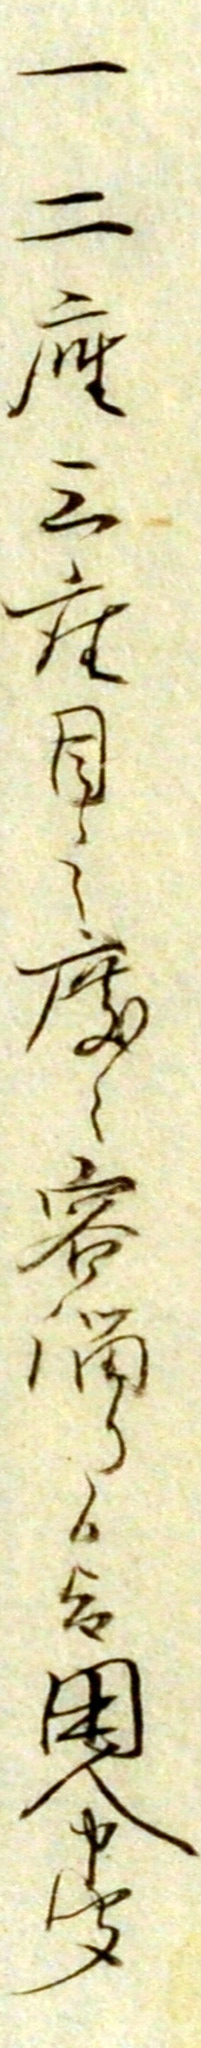一ニ座三座目之度々客溜り候旨用人申聞
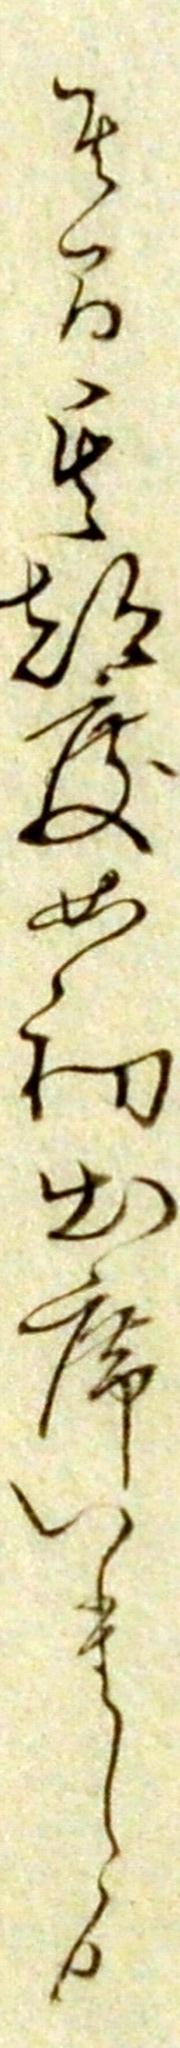候間其都度如初出席いたし候
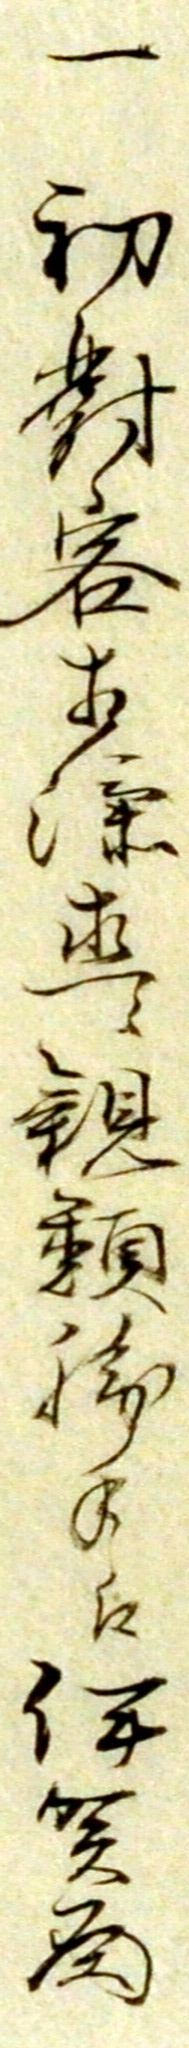一初対客相済直ニ親類勝手え伊賀殿
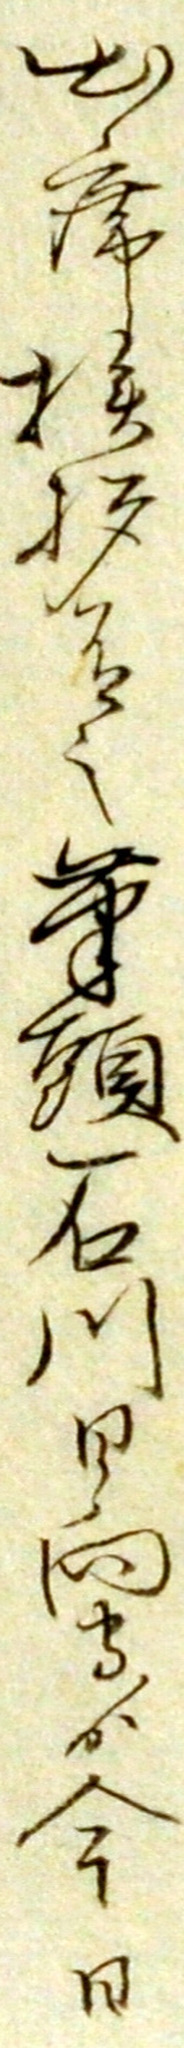出席挨拶有之筆頭石川日向守ゟ今日
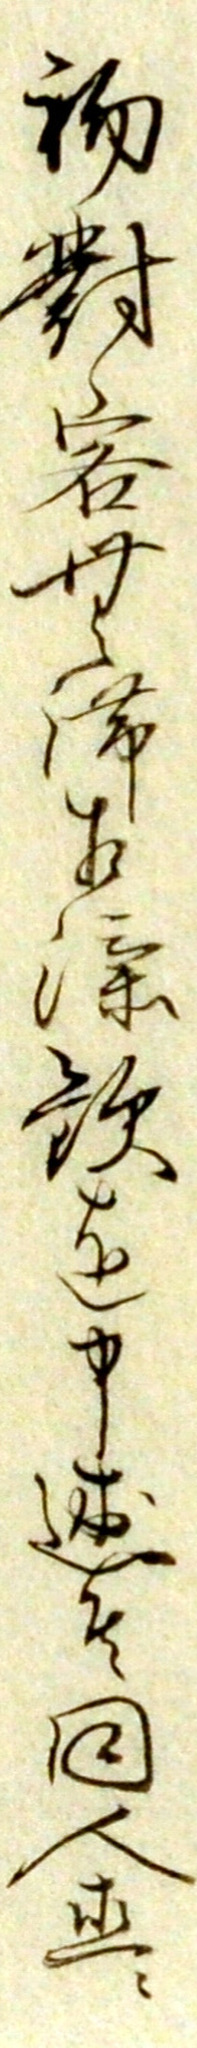初対客無滞相済歓を申述候同人直ニ
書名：諸名代相勤候節ノ留書外
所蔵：伊那市立高遠町図書館・合同会社AMANE
